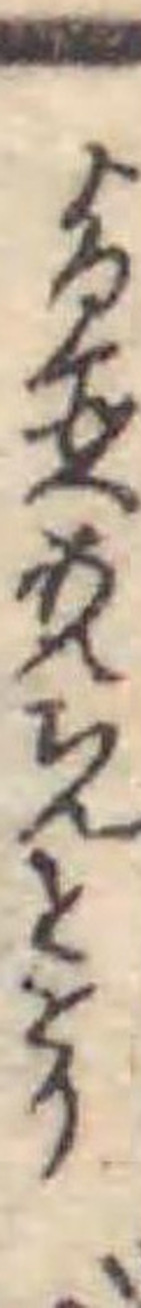よる所へあんちんとをり
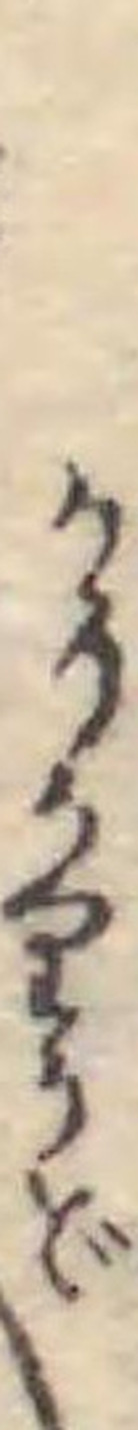かうかりうど
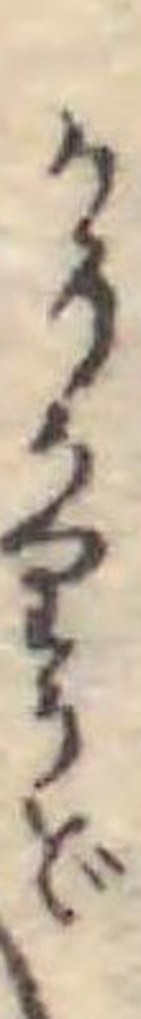かうかりうど
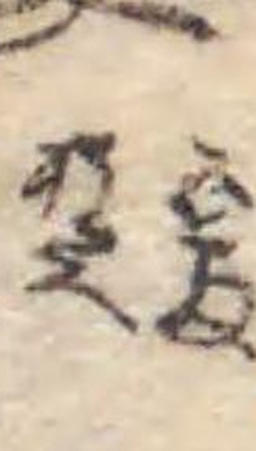あたへ
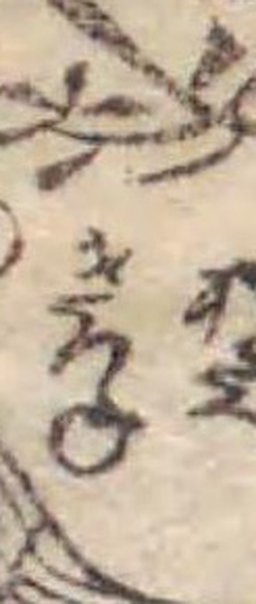きつね
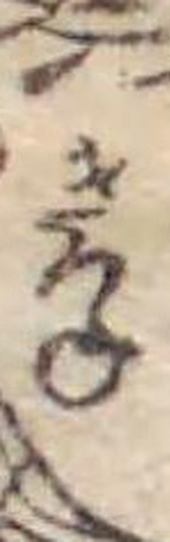きつね
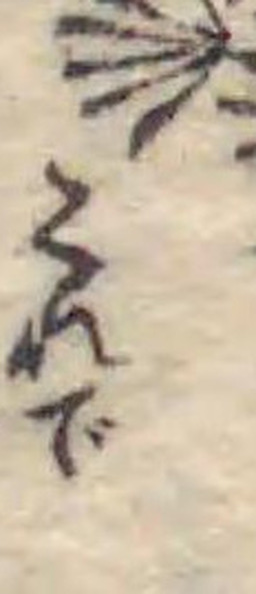これで
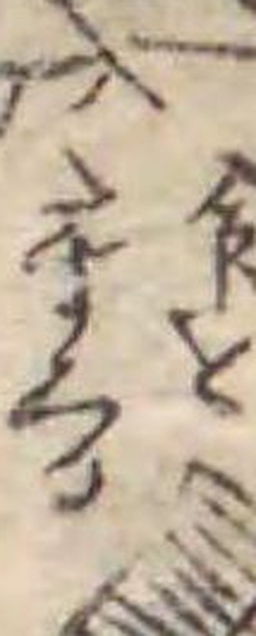たすくる
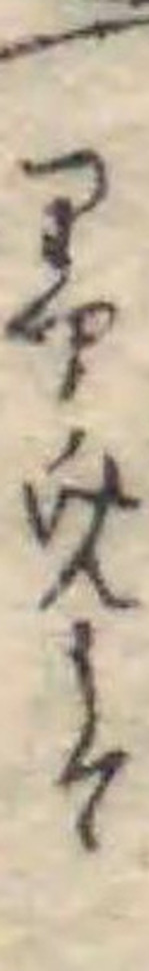りやうけんして
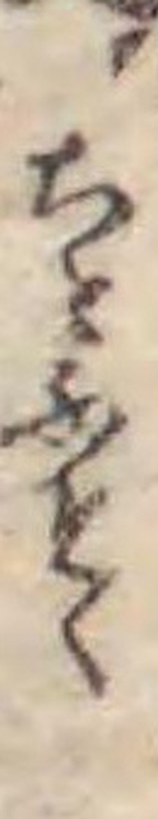ちとふそく
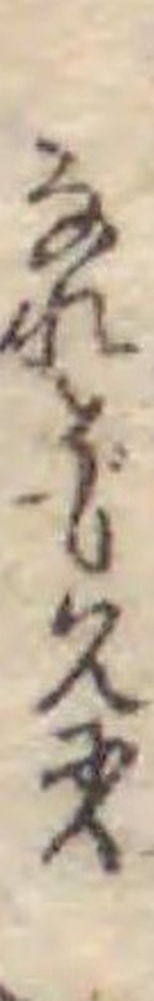なれどもかんにん
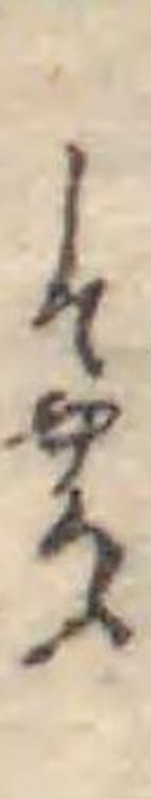してやろふ
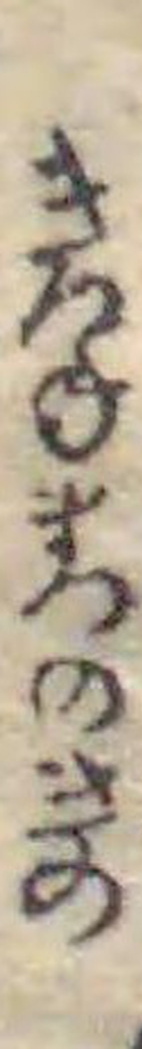きつねまつのきの
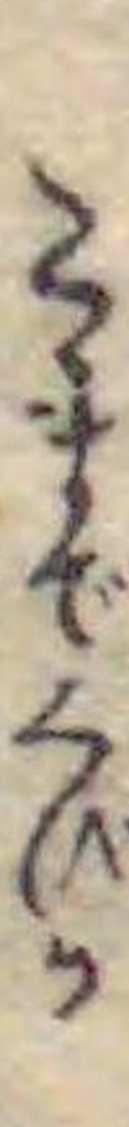こゝまでくびか
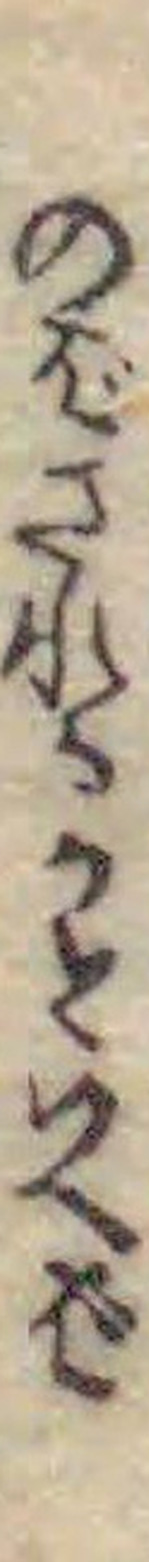のばされるかといへば
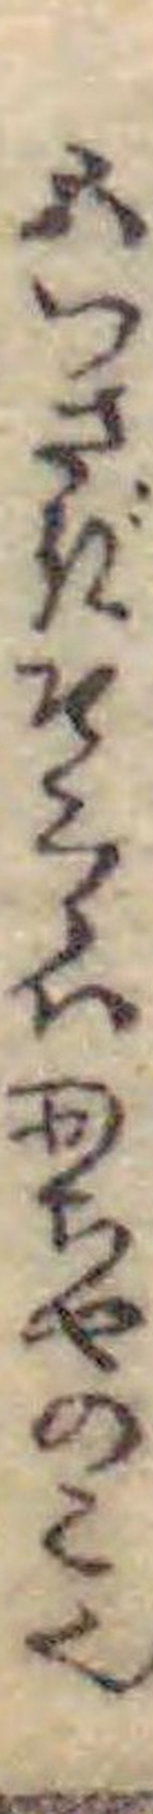五いさぎそこらはおちやのこ也
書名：鐘入七人化粧 : 3巻
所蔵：国立国会図書館 National Diet Library, JAPAN
